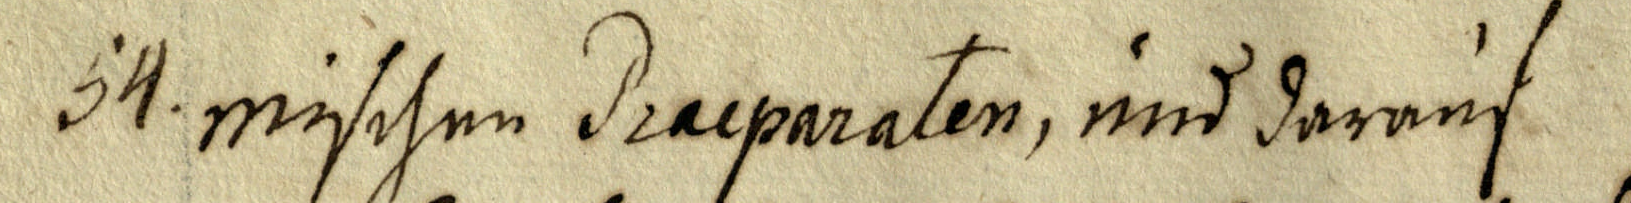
mischen Praeparaten, und darauf
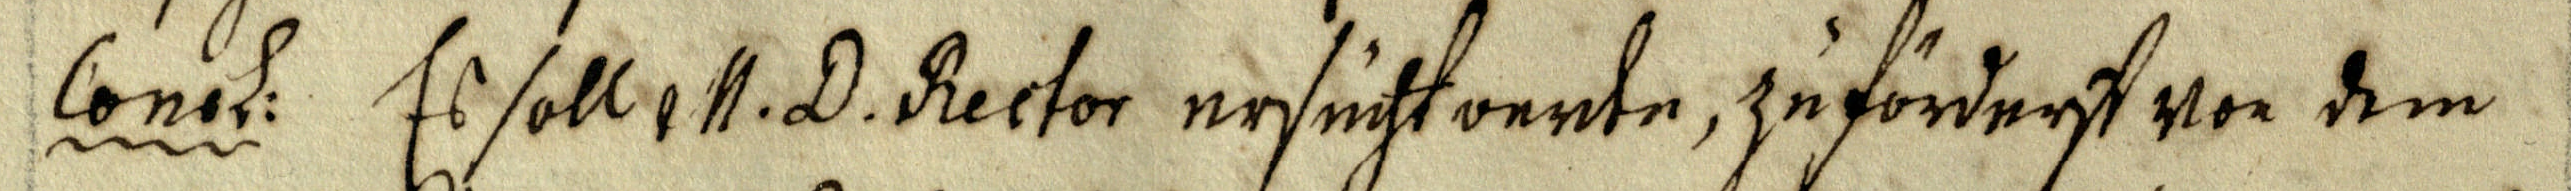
Concl. Es soll M. D. Rector ersucht werden, zuförderst von dem
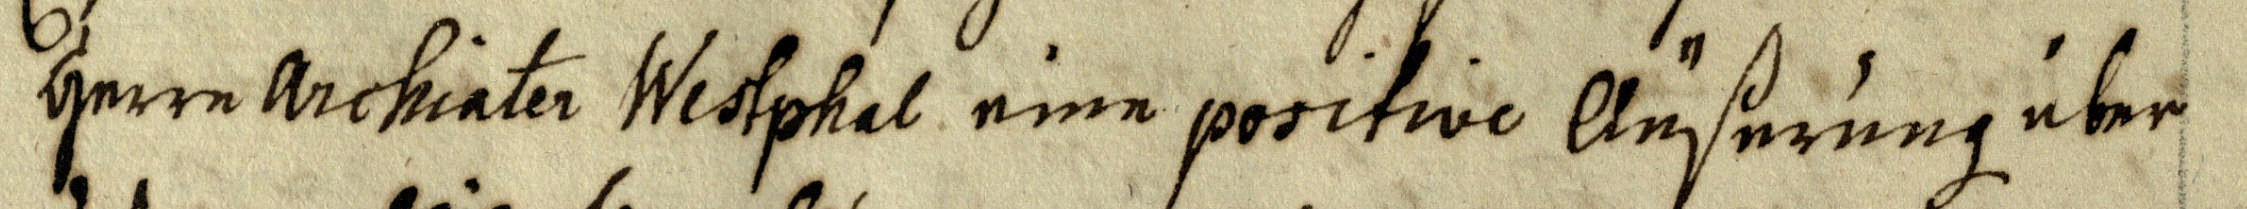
Herrn Archiater Westphal eine positive Äußerung über
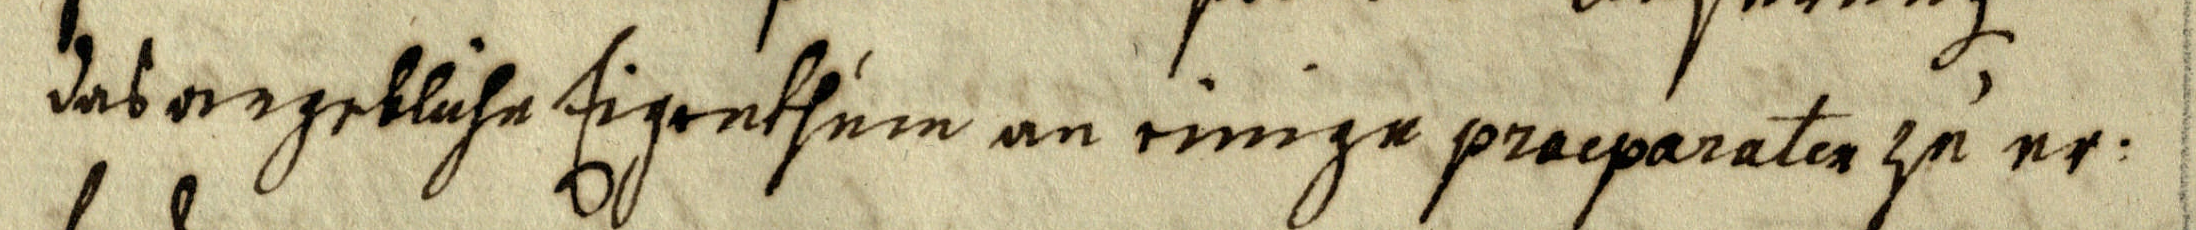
das angebliche Eigenthum an einige praeparaten zu er¬
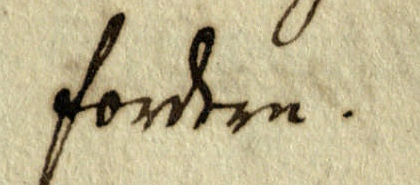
fordern.
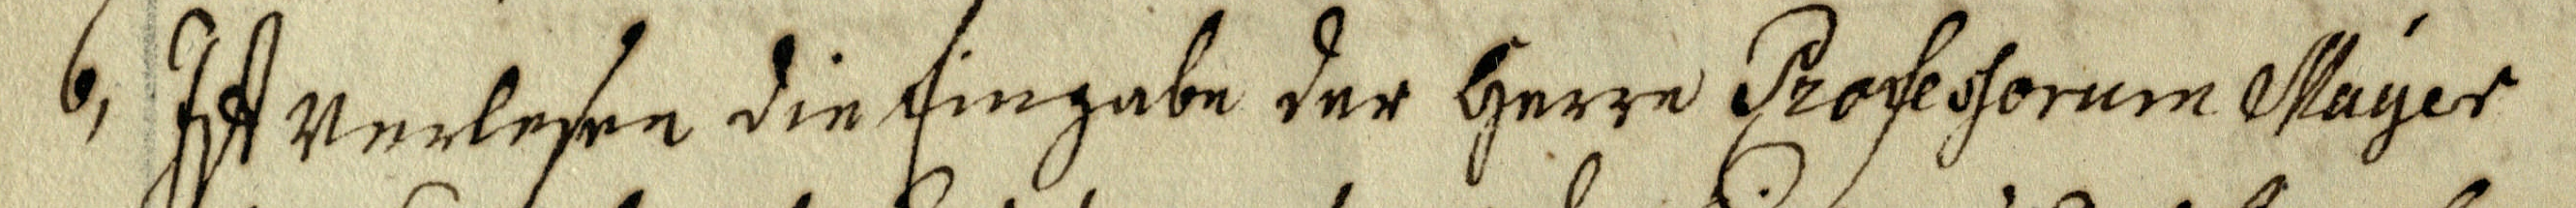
6, Ist verlesen die Eingabe der Herrn Professorum Maÿer
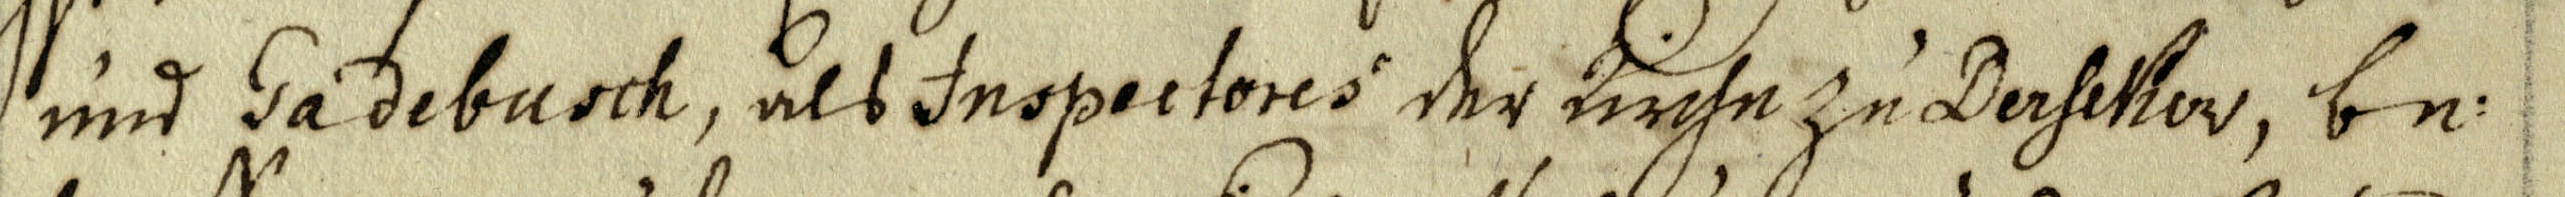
und Gadebusch, als Inspectores der Kirche zu Dersekow, be¬
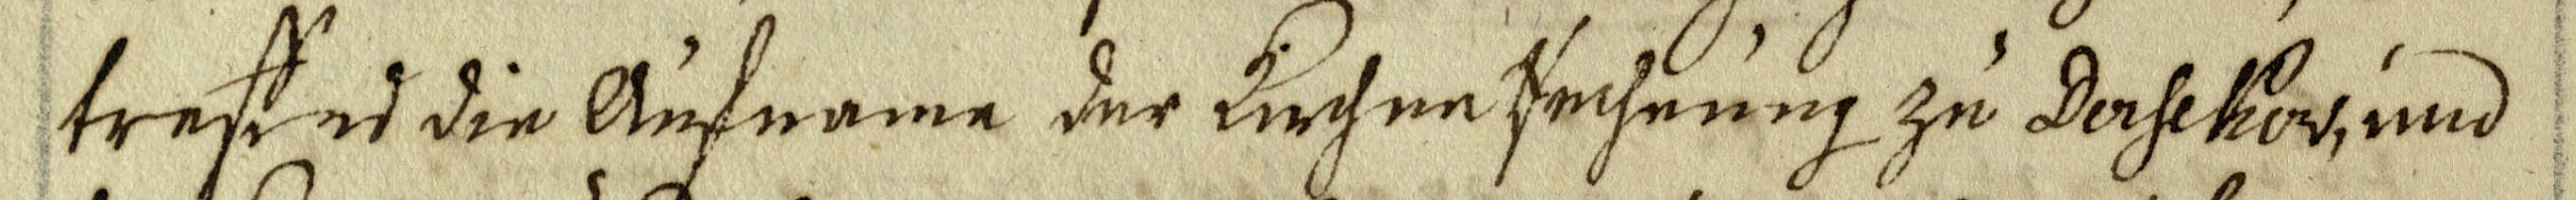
treffend die Aufnahme der Kirchen Rechnung zu Dersekow, und
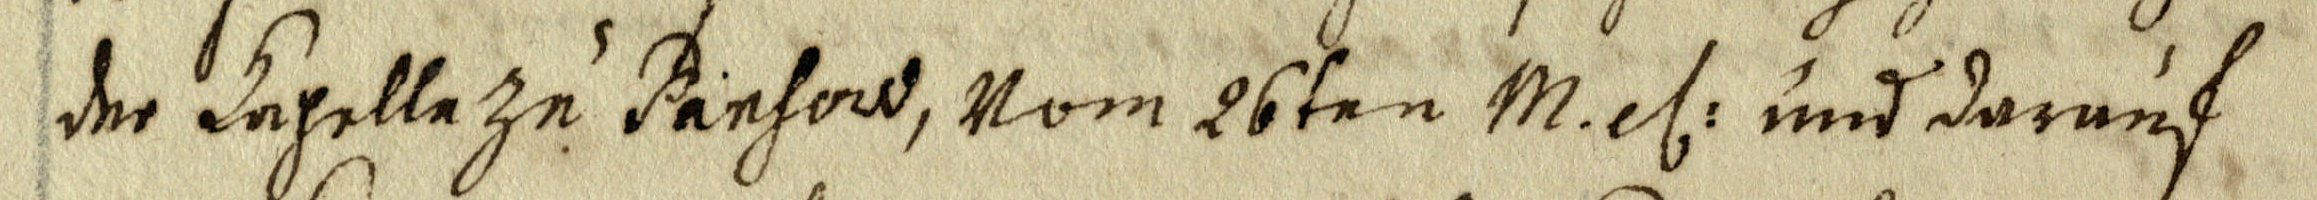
der Kapelle zu Pansow, vom 26 ten M. et und darauf
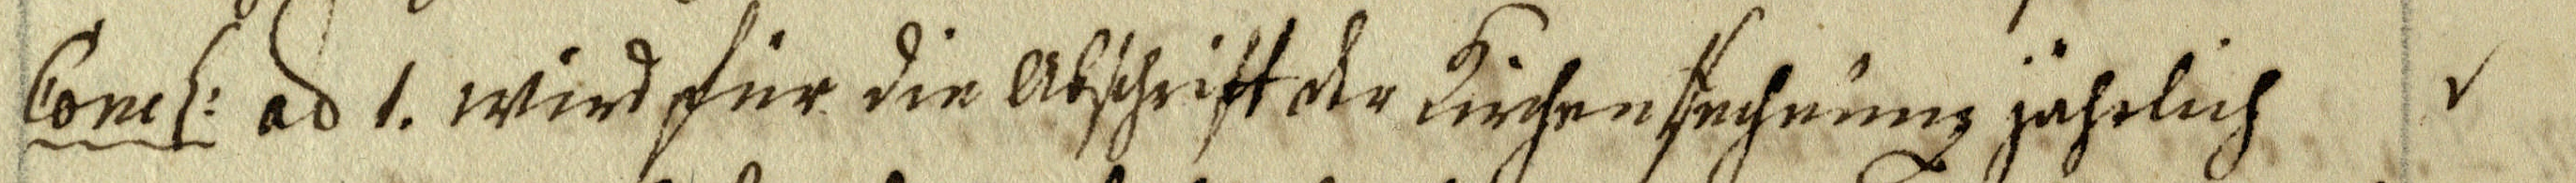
Concl. ad 1. wird für die Abschrift der KirchenRechnung jährlich
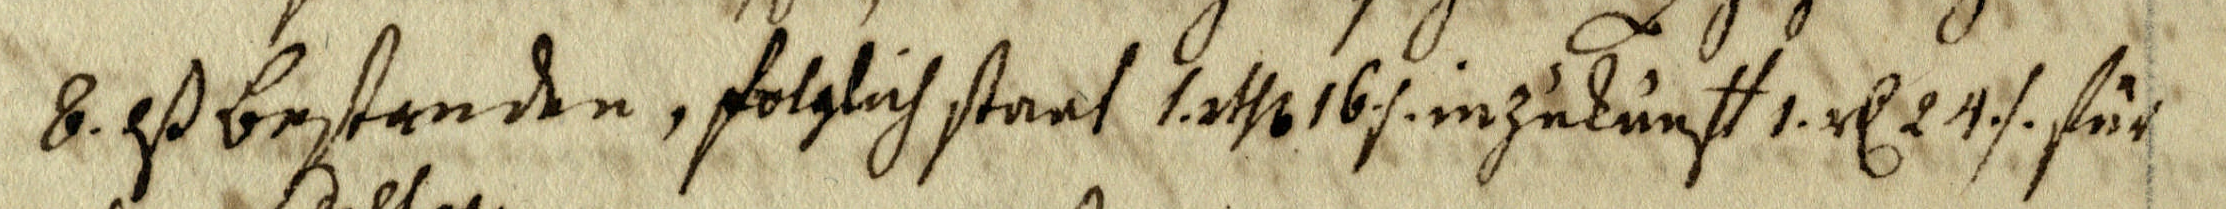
8. s. bestanden, folglich staat 1. rth. 16. s. in Zukunft 1. rt 24. s. für
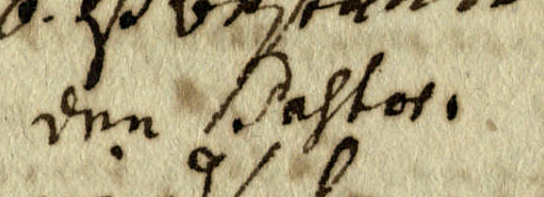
den Pastor.
